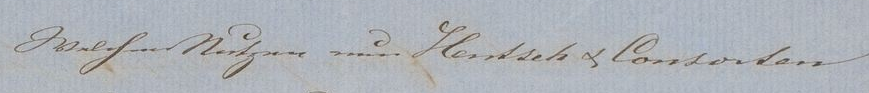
Welchen Nutzen nun Hentsch & Consorten
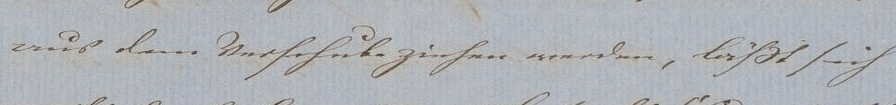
aus dem Verschube ziehen werden, läßt sich
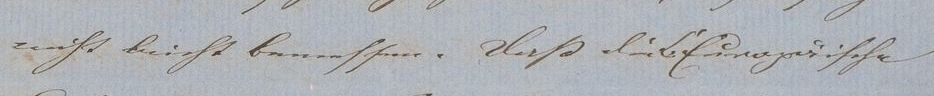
nicht leicht bemessen. Daß die C. Europäische
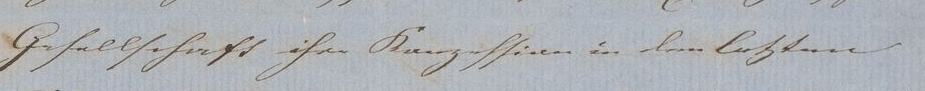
Gesellschaft ihre Konzession in den letzten
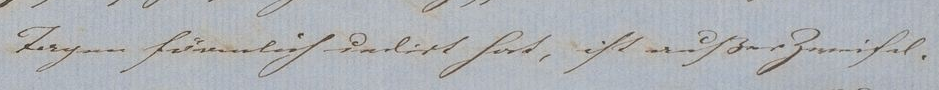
Tagen förmlich cedirt hat, ist außer Zweifel.
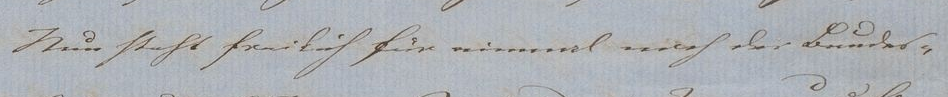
Nun steht freilich für einmal noch der Bundes-
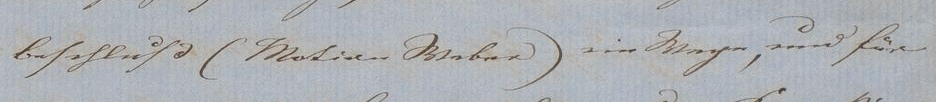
beschluß (Motion Weber) im Wege, und für
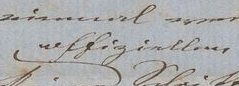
keine offiziellen
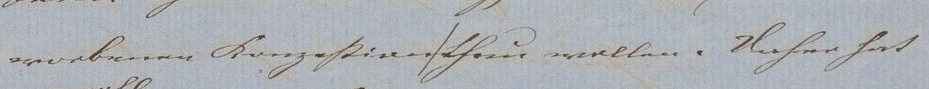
worbenen Konzeßionen thun wollen. Daher hat
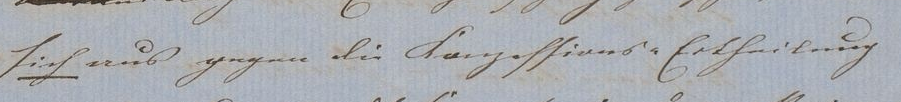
sich aus gegen die Konzessions-Ertheilung
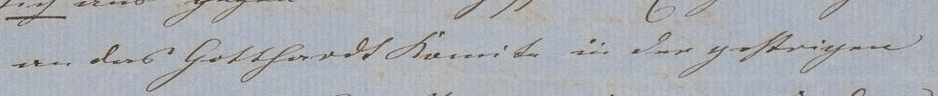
an das Gotthardt Komite in der gestrigen
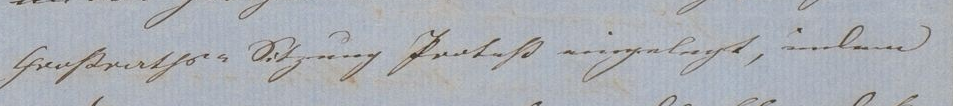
Großraths-Sitzung Protest eingelegt, indem
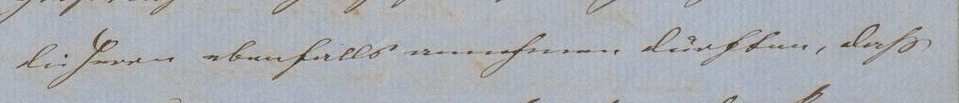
die Herrn ebenfalls annehmen dürften, daß
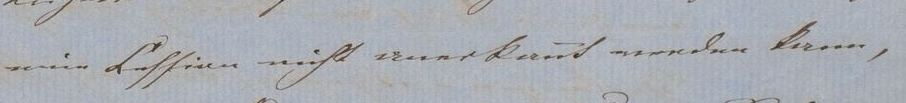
eine Cession nicht anerkannt werden kann,
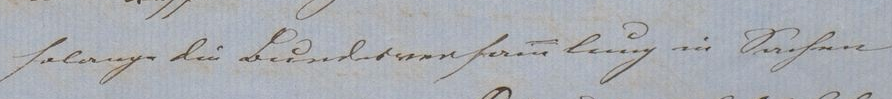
solange die Bundesversammlung in Sachen
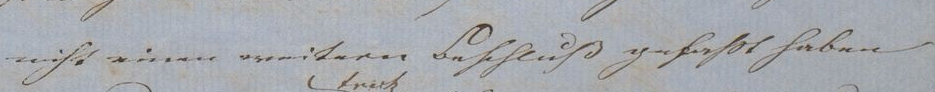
nicht einen weitern Beschluß gefaßt haben
